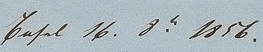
Basel, 16. 8r 1856.
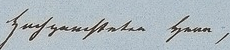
Hochgeachteter Herr,
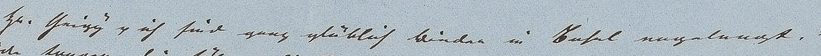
Hr. Geigy & ich sind ganz glüklich wieder in Basel angelangt.
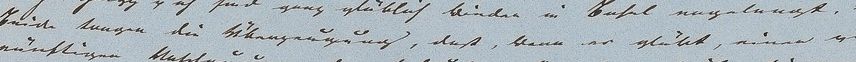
Beide tragen die Überzeugung, daß, wenn es glükt, einer ver-
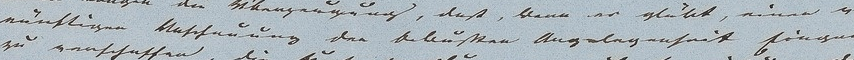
nünftigen Anschauung der bewußten Angelegenheit Eingang
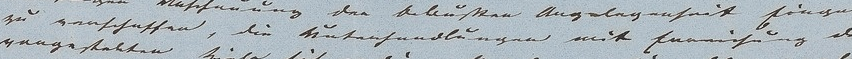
zu verschaffen, die Unterhandlungen mit Erreichung des
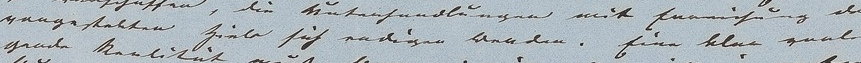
vorgestekten Ziels sich endigen werden. Eine klar vorlie-
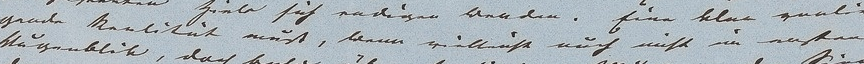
gende Realität muß, wenn vielleicht auch nicht im ersten
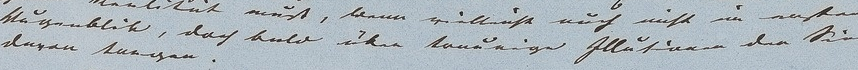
Augenblik, doch bald über traurige Illusionen den Sieg
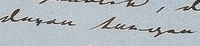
davon tragen.
